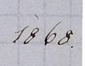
1868.
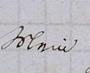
Mein
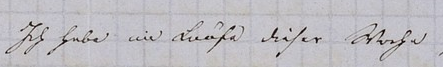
Ich habe im Laufe dieser Woche
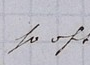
so oft
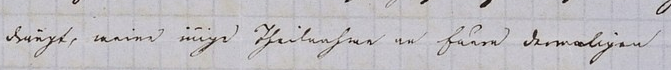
drängt, meine innige Theilnahme an Euern dermaligen
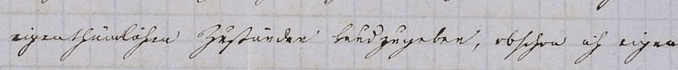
eigenthümlichen Zuständen kundzugeben, obschon ich eigent-
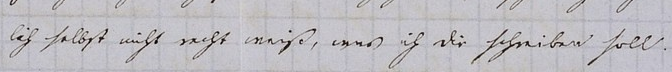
lich selbst nicht recht weiß, was ich Dir schreiben soll.
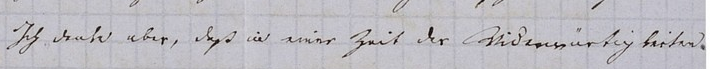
Ich denke aber, daß in einer Zeit der Widerwärtigkeiten,
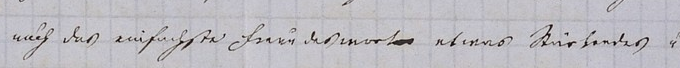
auch das einfachste Freundeswortes etwas Stärkendes u.
